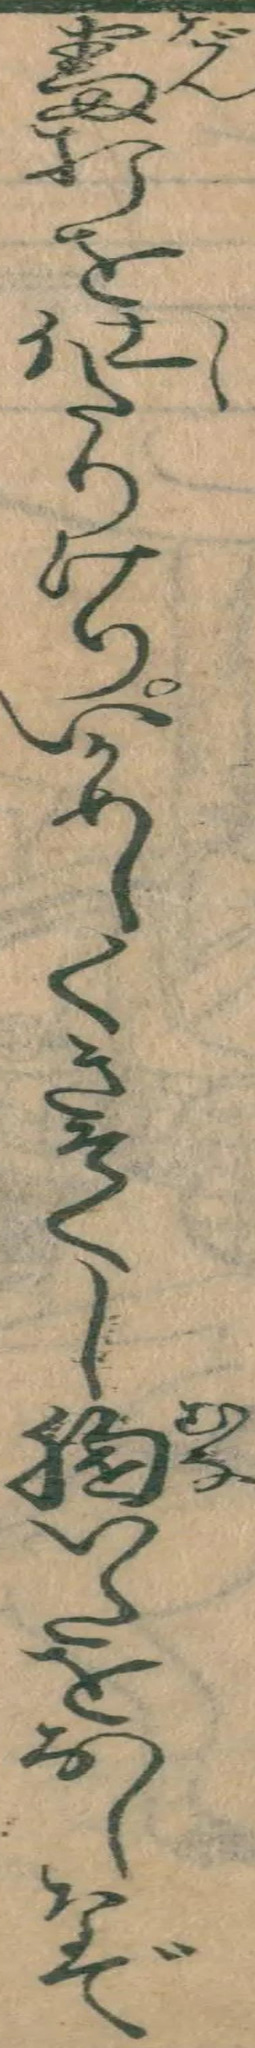番打を仕たりけり。いかめしくきそくし胸いたをおしなで
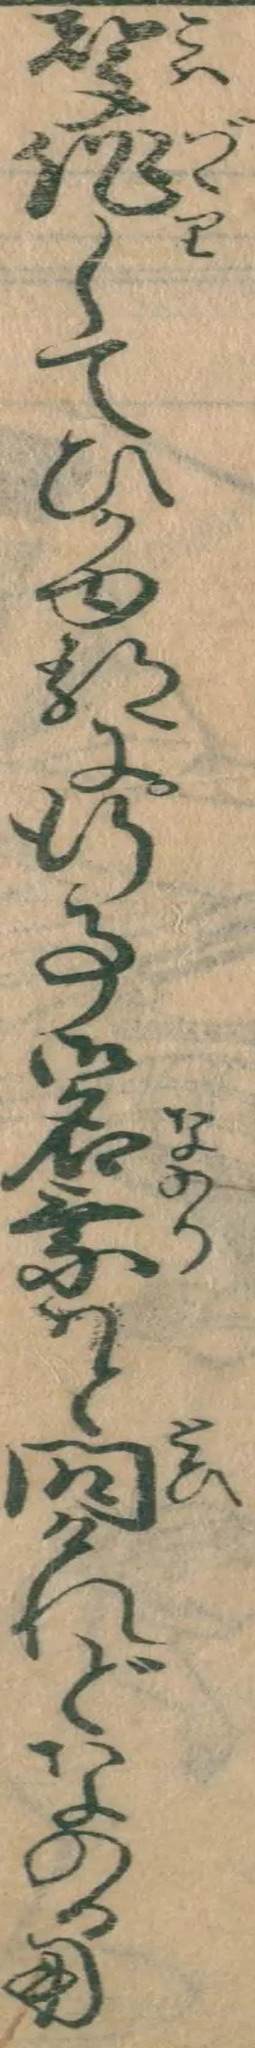声作してひかゆるに。行事御名乗はと問けれどなのる用
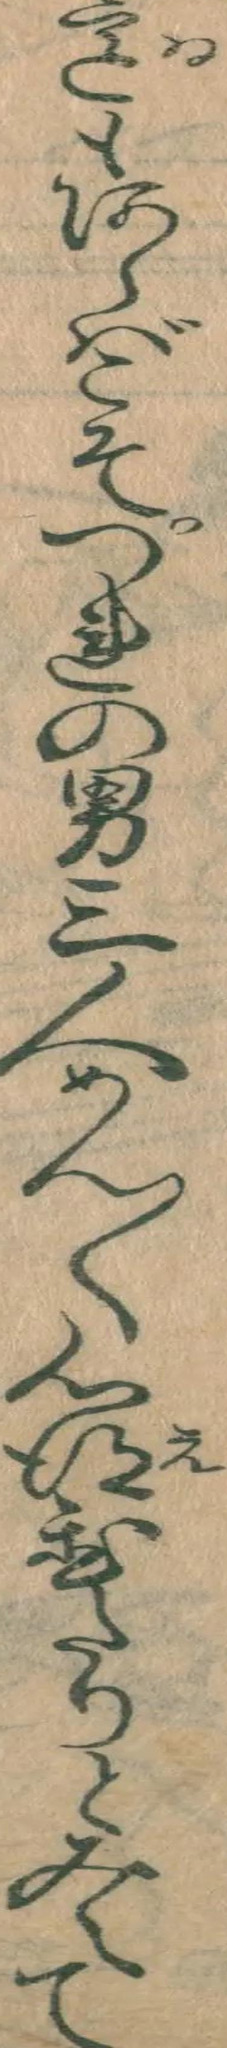意もあらばこそ。つれの男三人めん〳〵心得置たりとみえて
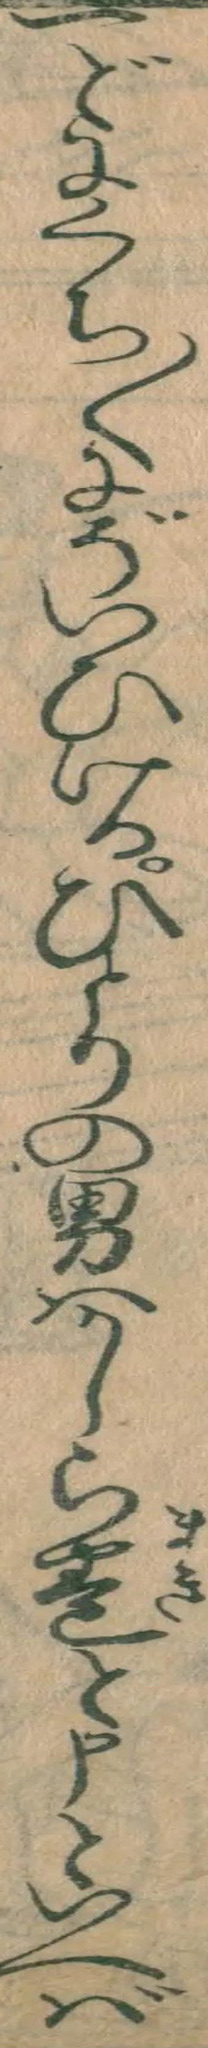一どにくち〳〵にぞいひける。ひとりの男はかしら巻と申といへば
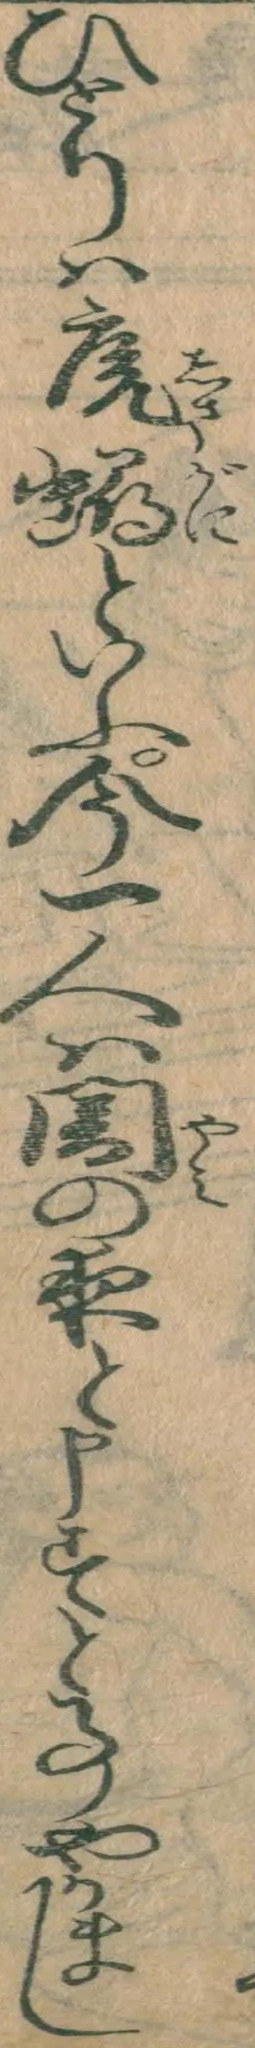ひとりは蟹といふ。今一人は闇の夜と申すと事やかまし
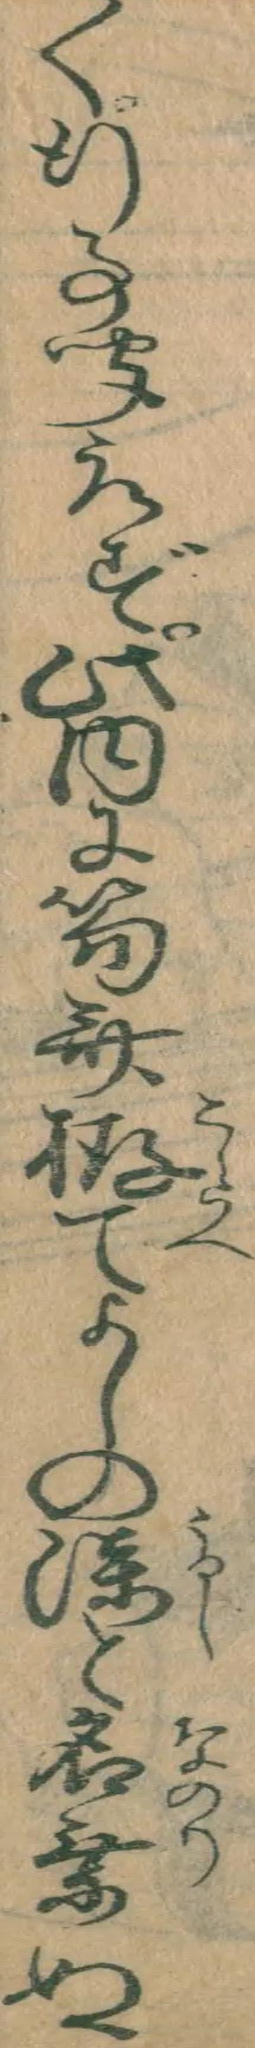〱。行事聞取ず。此内に筍斎拵てよしの漆と名乗ぬ

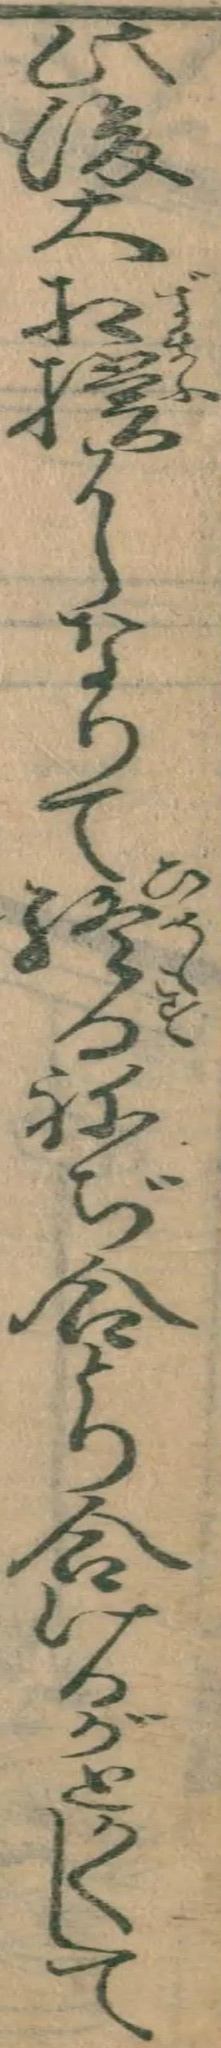此後大相撲になりて終日ねぢ合とり合けるがとかくして
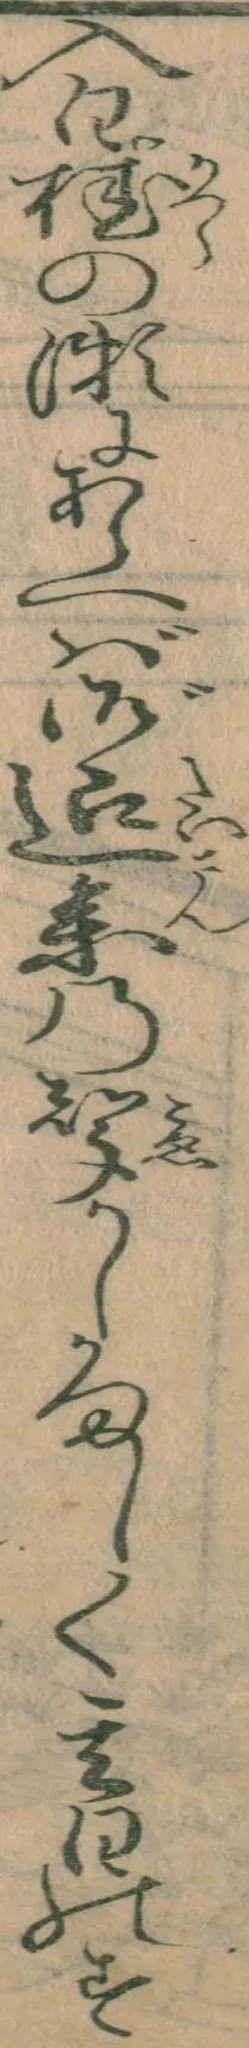入日。桂の瀬にあらへば御退参の声かしかましく其日のす
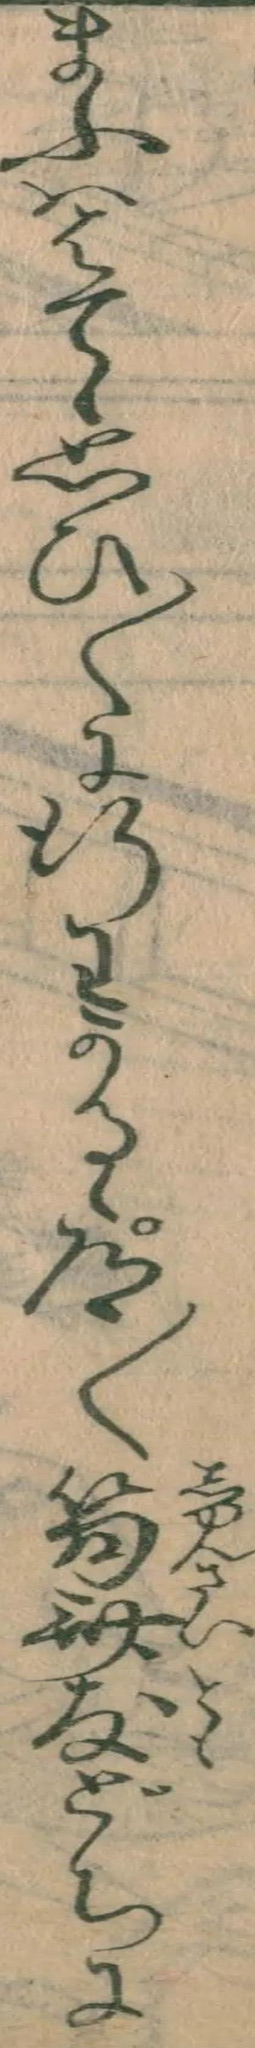まふははてゝ思ひ〳〵に行わかるゝ。道々筍斎友どちに
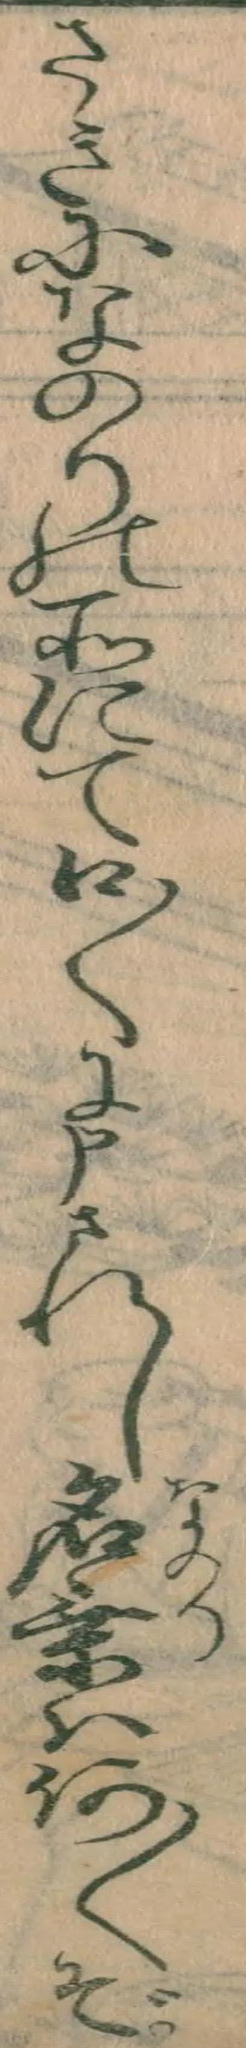さきになのりの所にて口々に申されし名乗は何々ぞ。
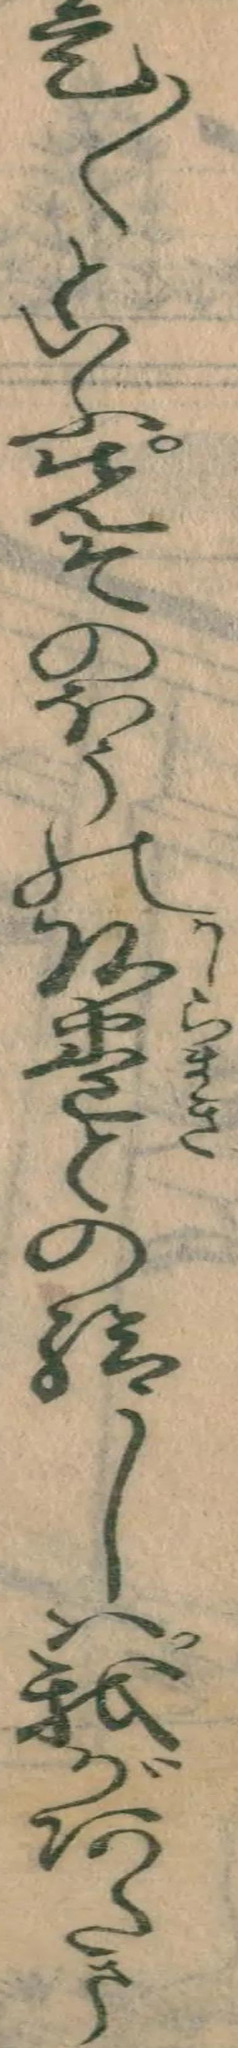是々といふ。先そのほうの頭巻との給しは。我があたま
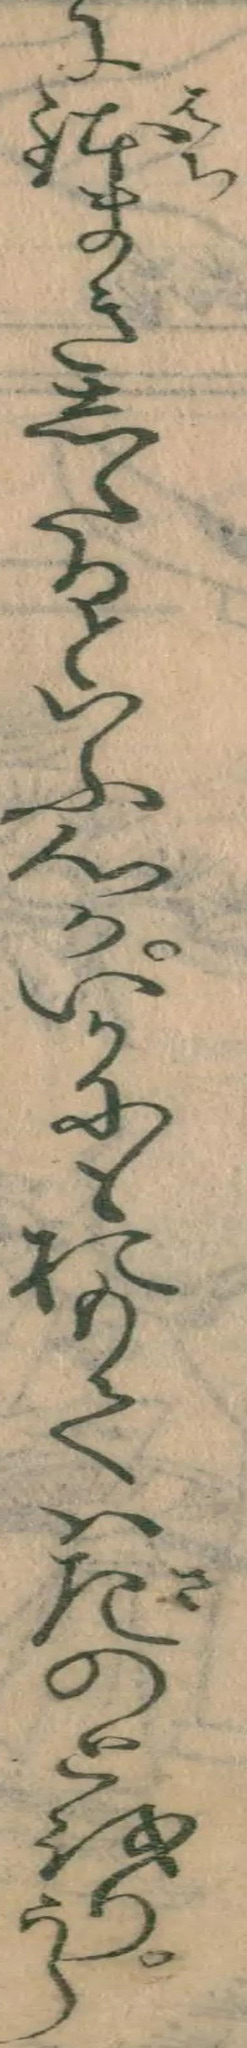に鉢まきしたるといふ心か。いかにもおもては左のとをり。うら
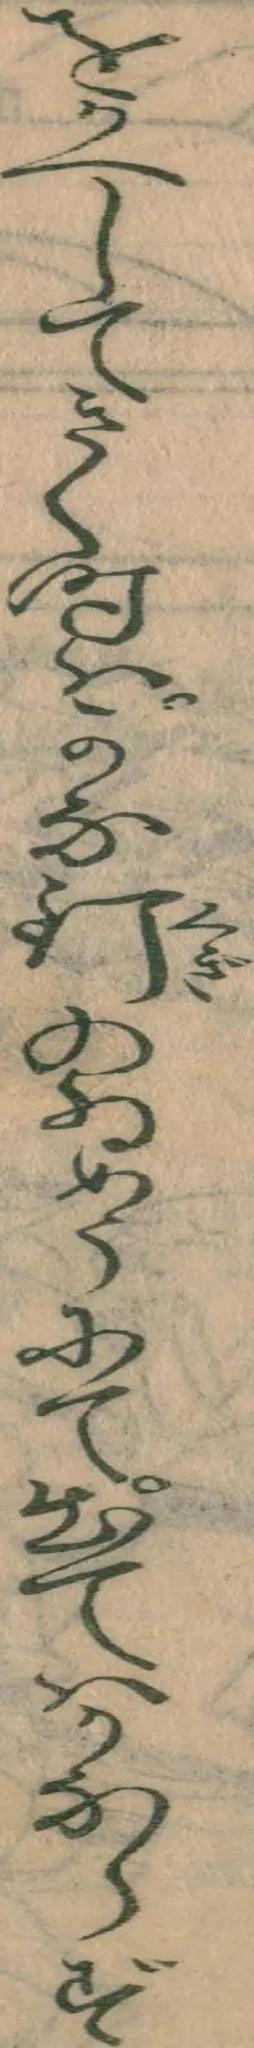をかへしてきく時は。かな釘のゐめうにて。出てはかならず
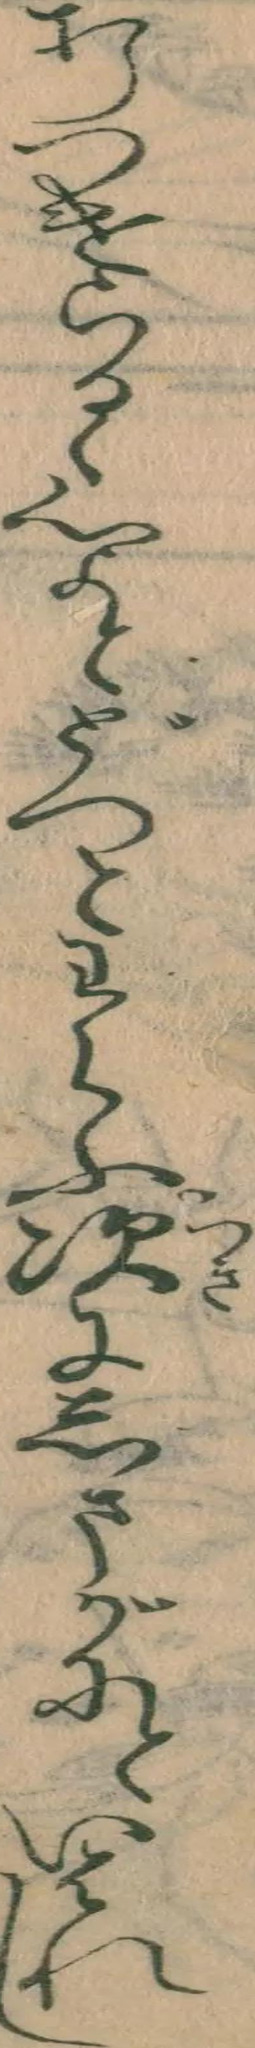打つけらるゝ心よとどつとわらふ。次にしまがにといはれし
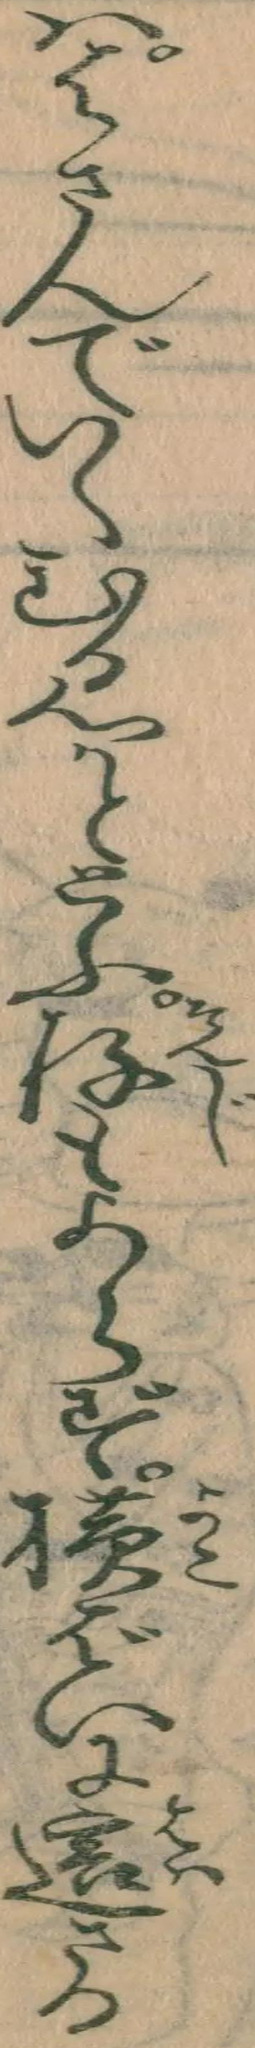は。はさんでいたむる心かととふ。存もよらず。横ばいに這さる
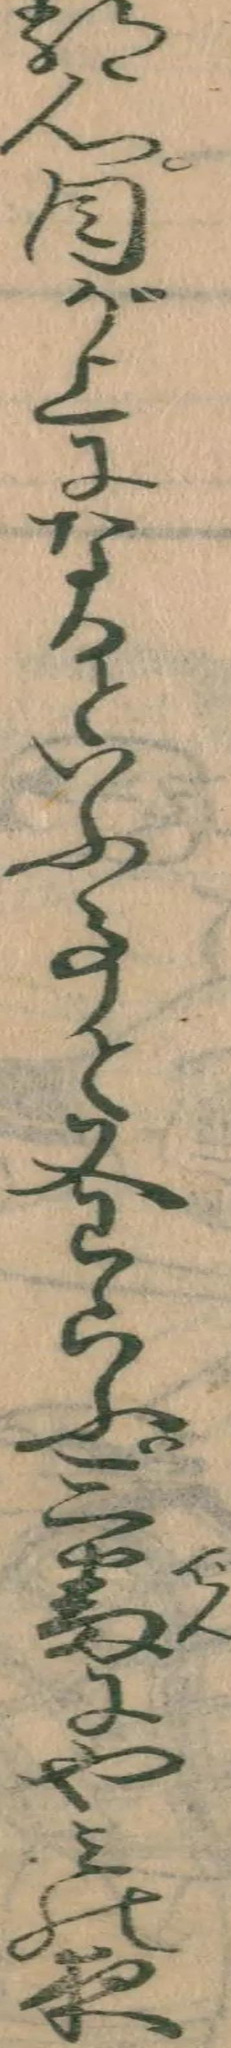る心。目が上になるといふ事と又わらふ。三番にやみの夜
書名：新竹斎 5巻
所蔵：国立国会図書館 National Diet Library, JAPAN
